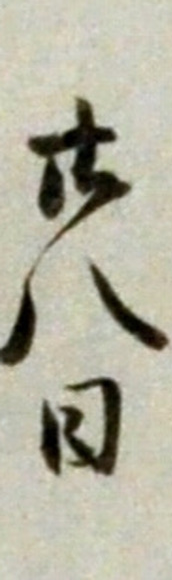廿八日
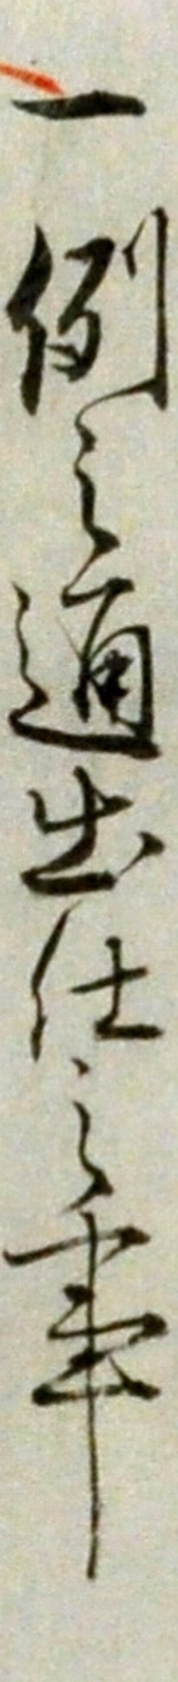一例之通出仕之事
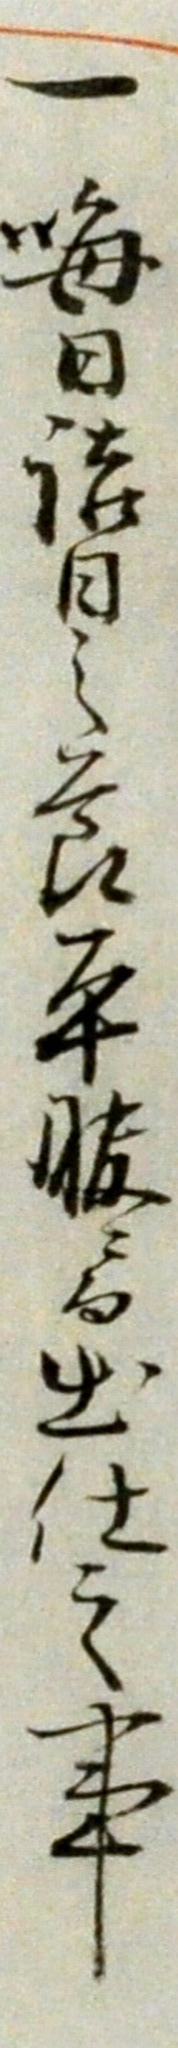一晦日詰日之節平服にて出仕之事
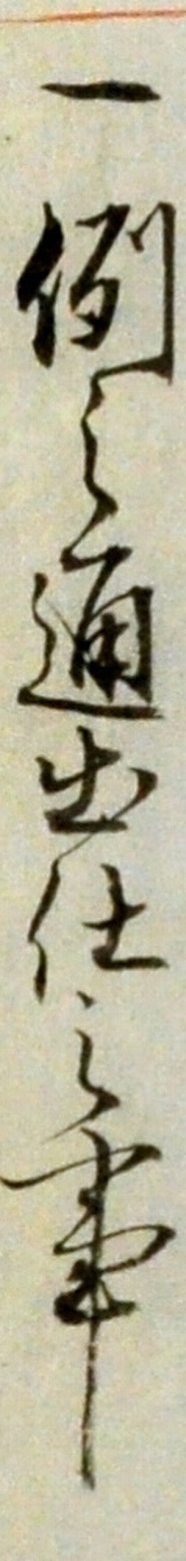一例之通出仕之事
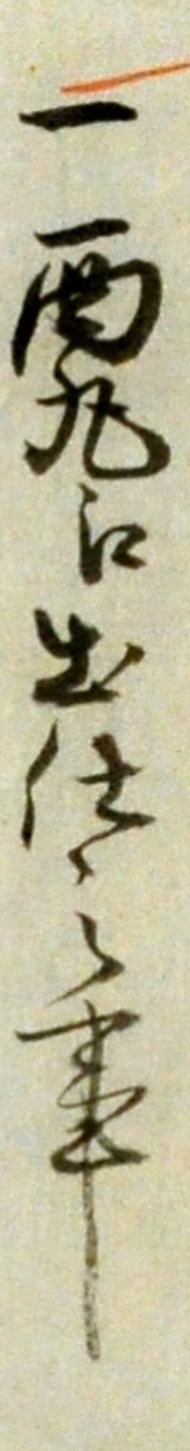一西丸え出仕之事
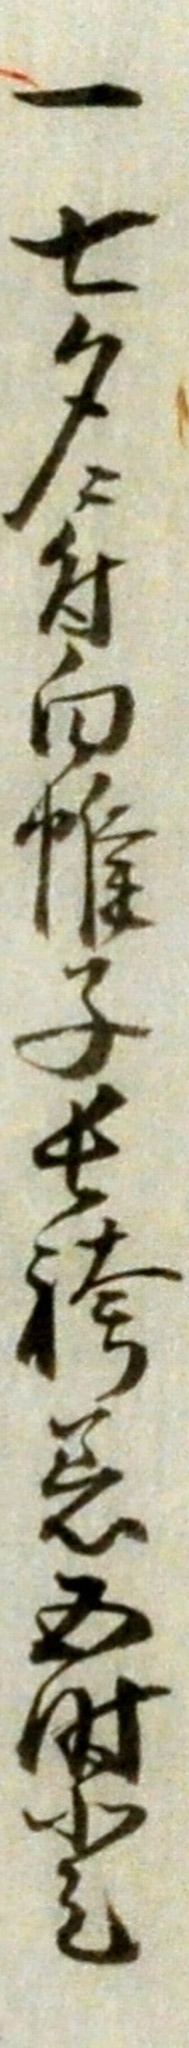一七夕に付白帷子長袴着五時登
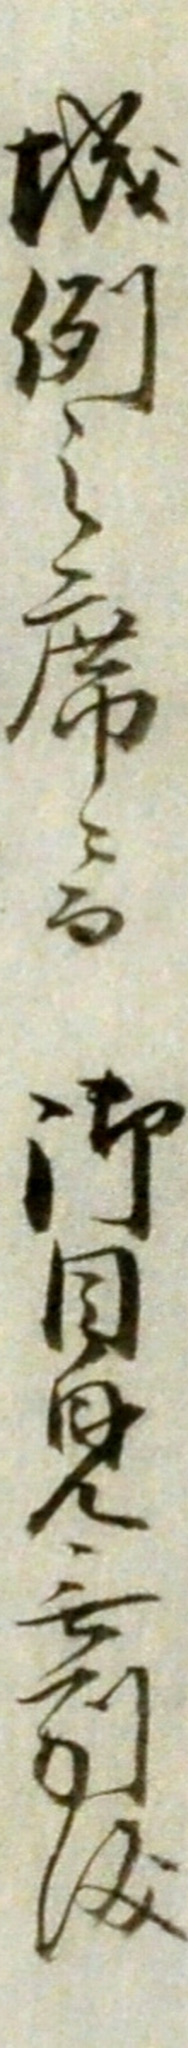城例之席にて御目見無別儀
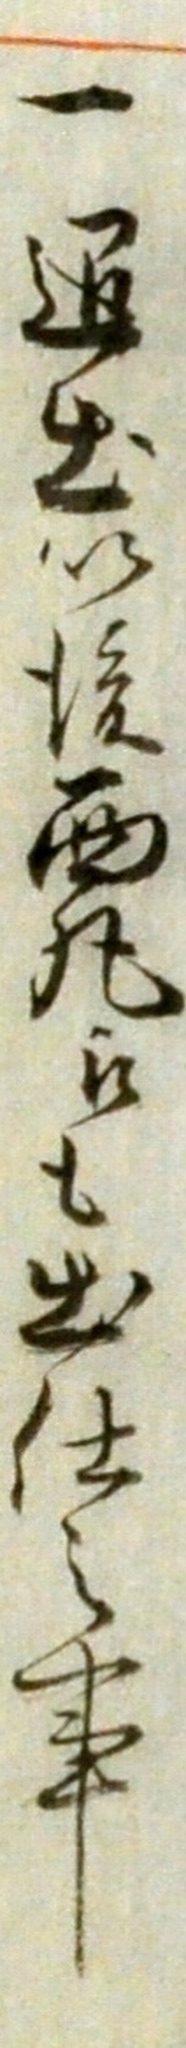一退出以後西丸えも出仕之事
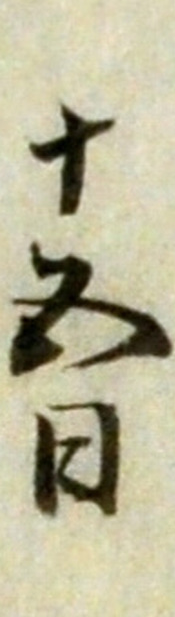十五日
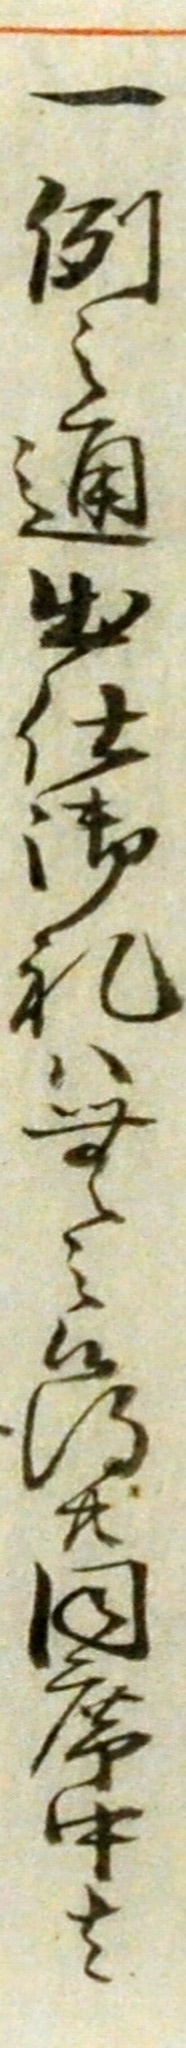一例之通出仕御礼は無之候得共同席中は
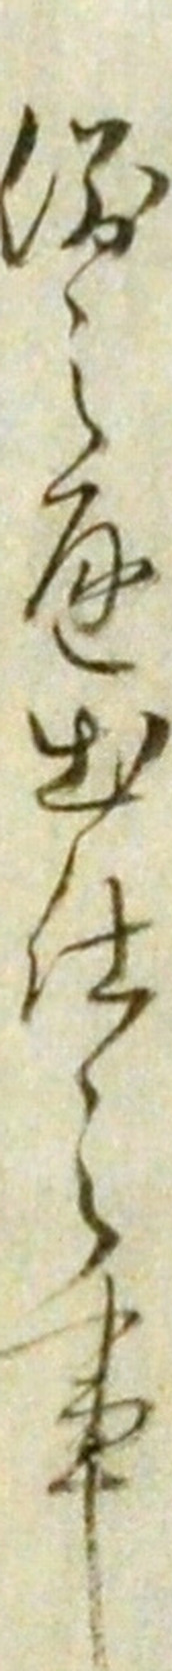例之通出仕之事
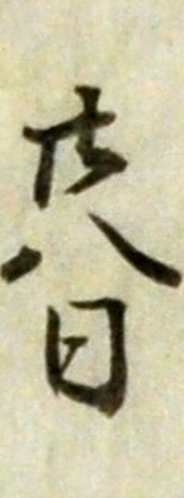廿八日
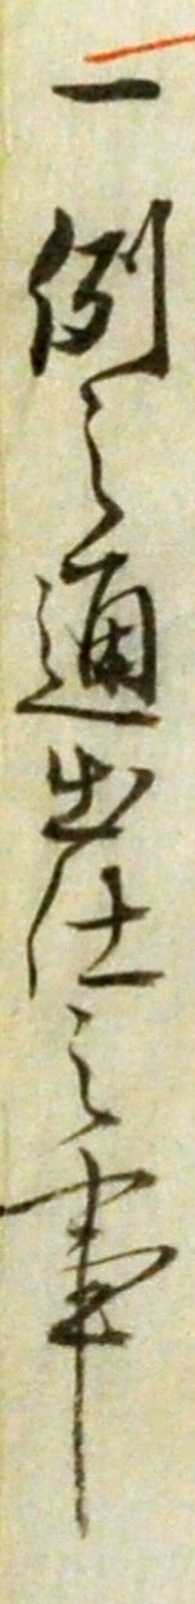一例之通出仕之事
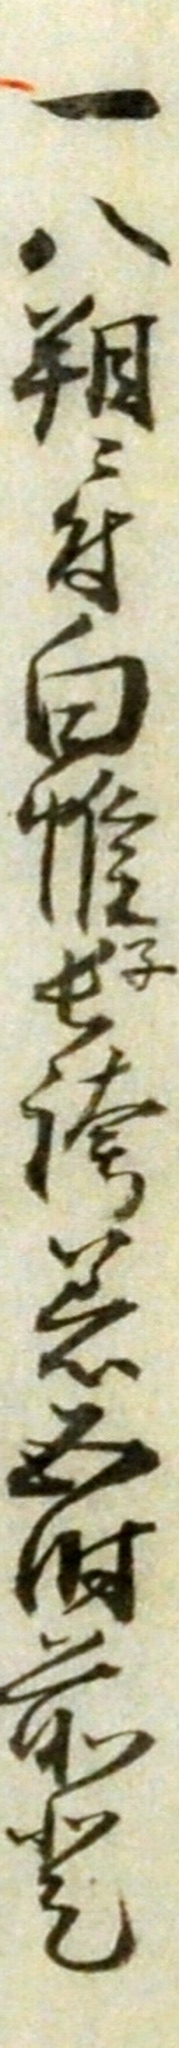一七夕に付白帷子長袴着五時登

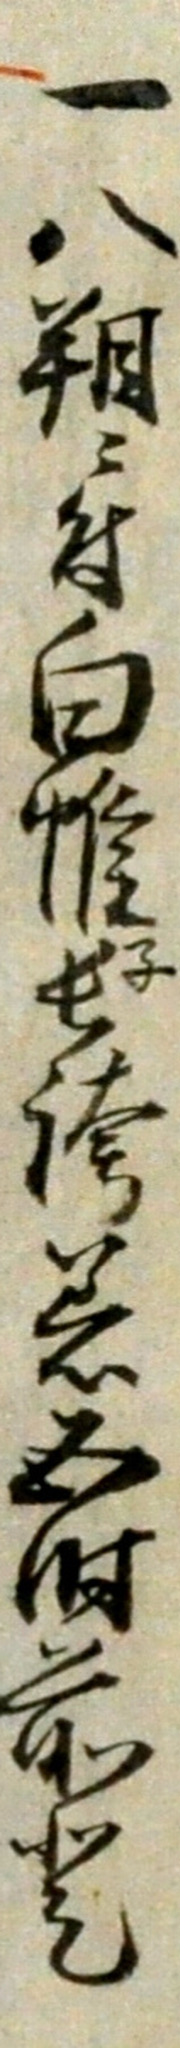一八朔に付白帷子長袴着五時前登
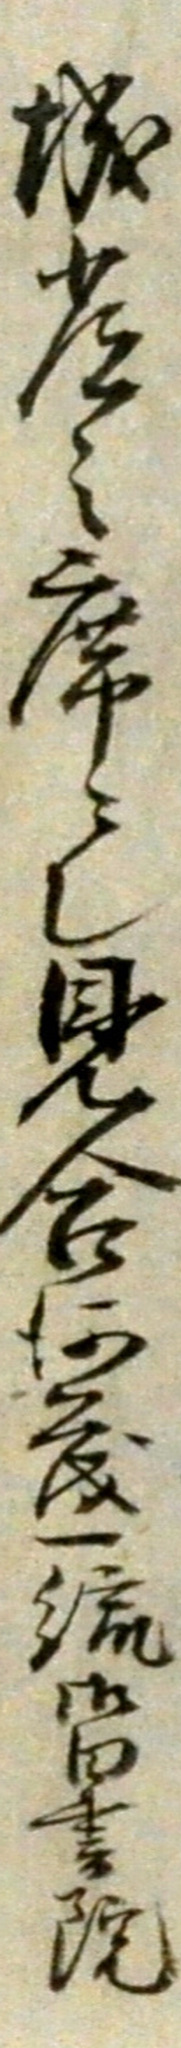城常之席にて見合何も一統御白書院
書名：申合帳〔一括〕
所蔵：伊那市立高遠町図書館・合同会社AMANE
